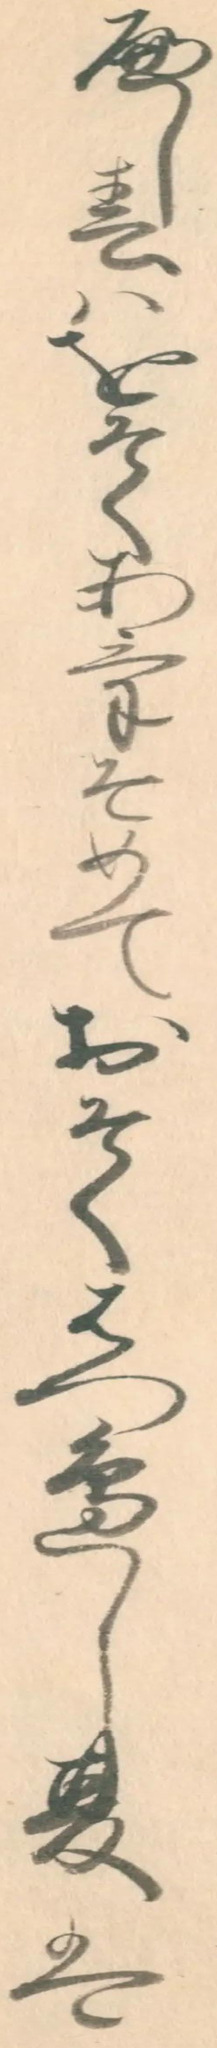へし春はをそくあけそめておそくはつへし夏は
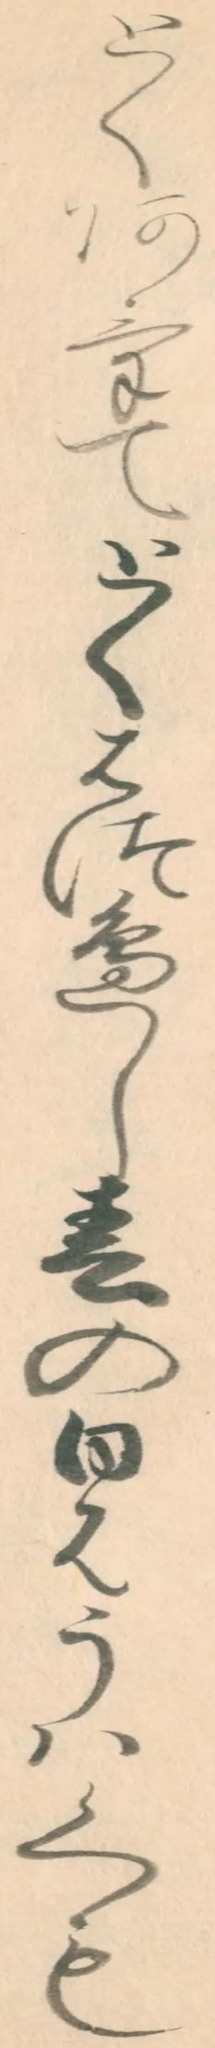とくあけてとくはつへし春の日はうはくも
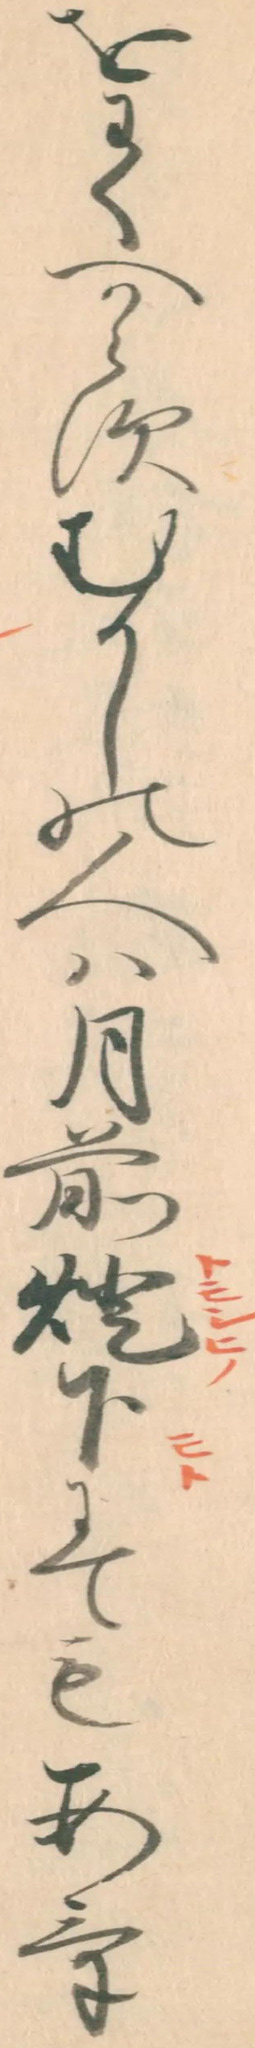をわくへからすむかしの人は月前灯下にてもあけ
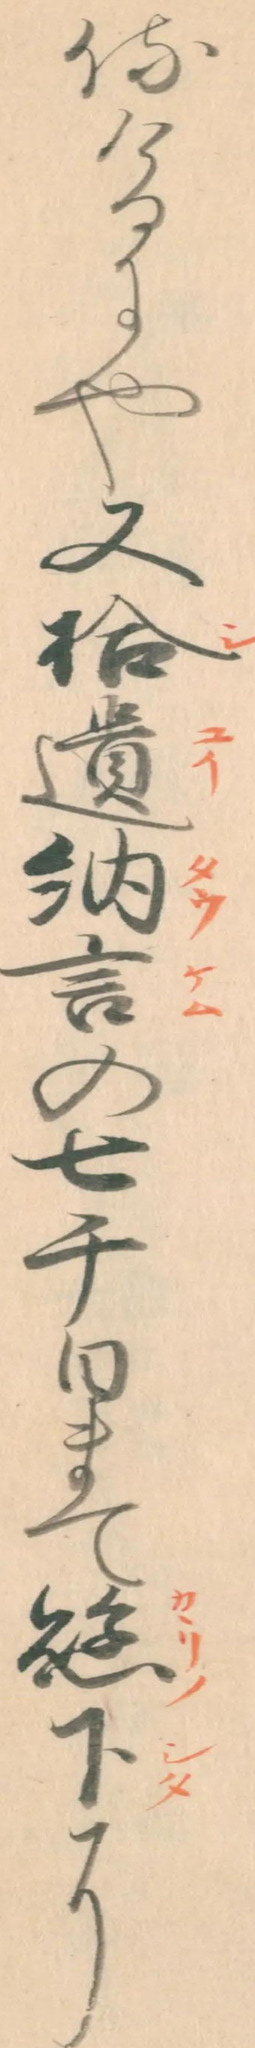侍けるにや又拾遺納言の七千日まて懸下に
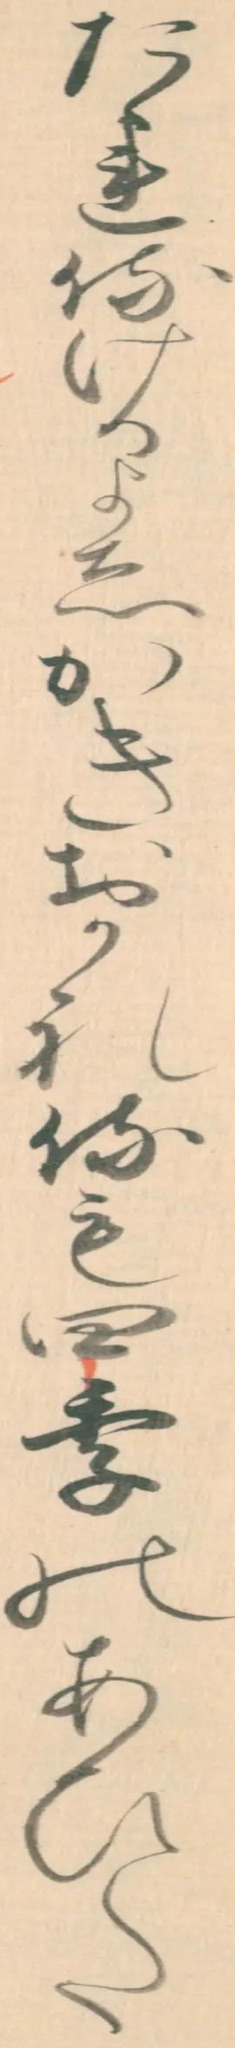たれ侍けるよしかきおかれ侍も四-季のあひた
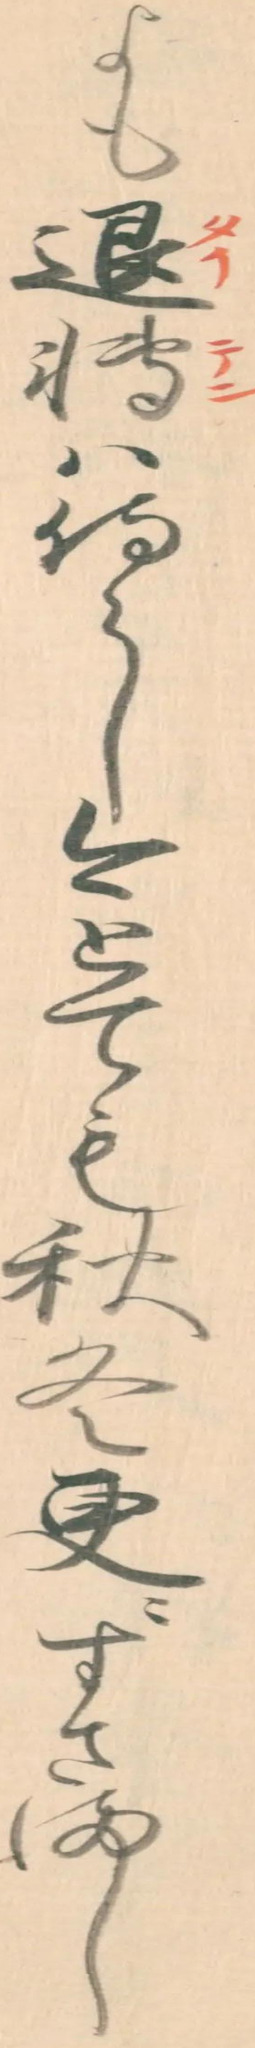よも退転は侍らし今とても秋更更にすさまし
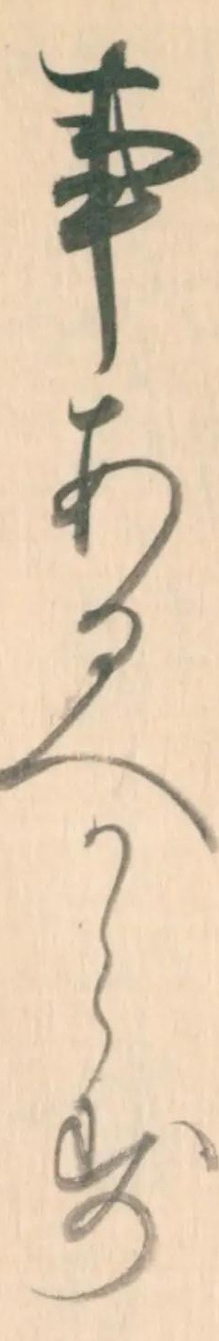事あるへからす
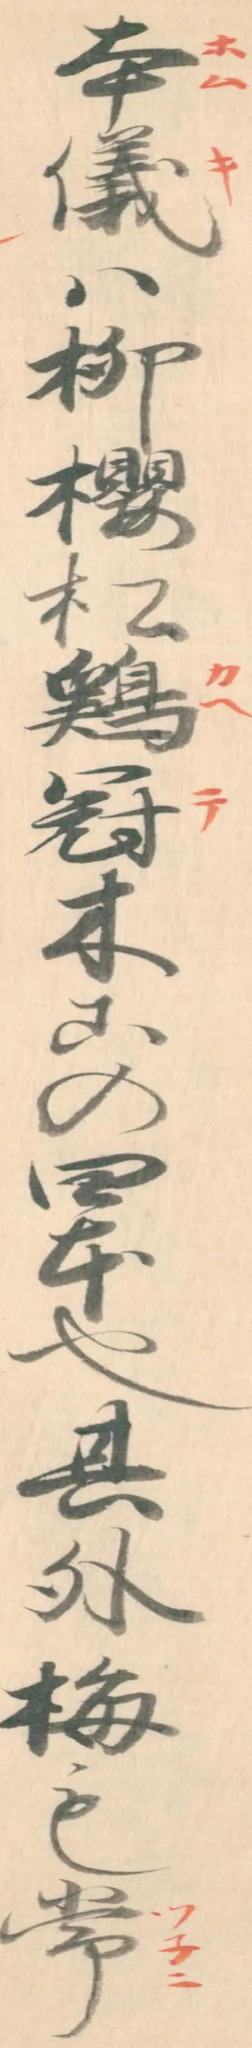本儀は柳櫻松鶏冠木この四本也其外梅も常
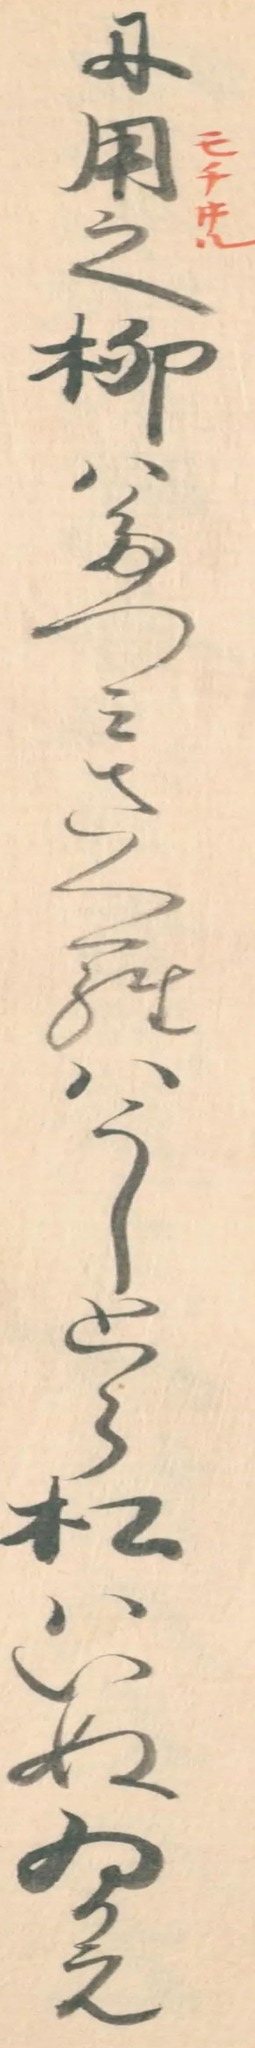に用之柳はたつみさくらはうしとら松はいぬゐかえ
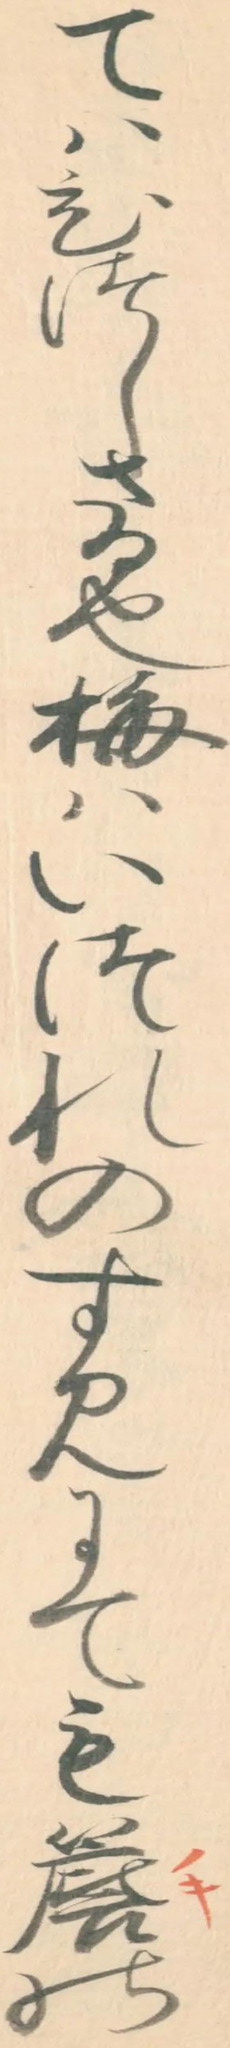てはひつしさる也梅はいつれのすみにても簷の
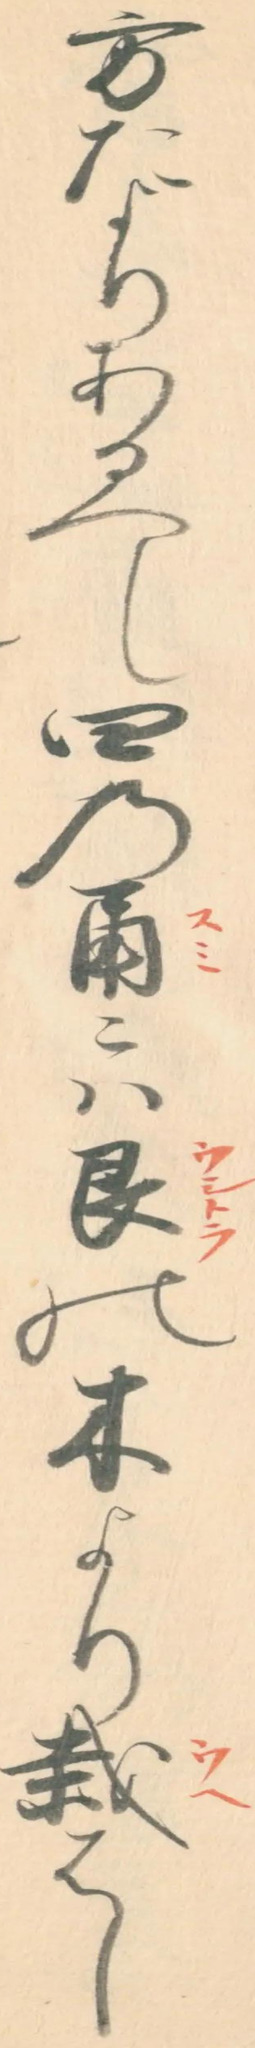方たよりあるへし四の角には艮の木より栽はし
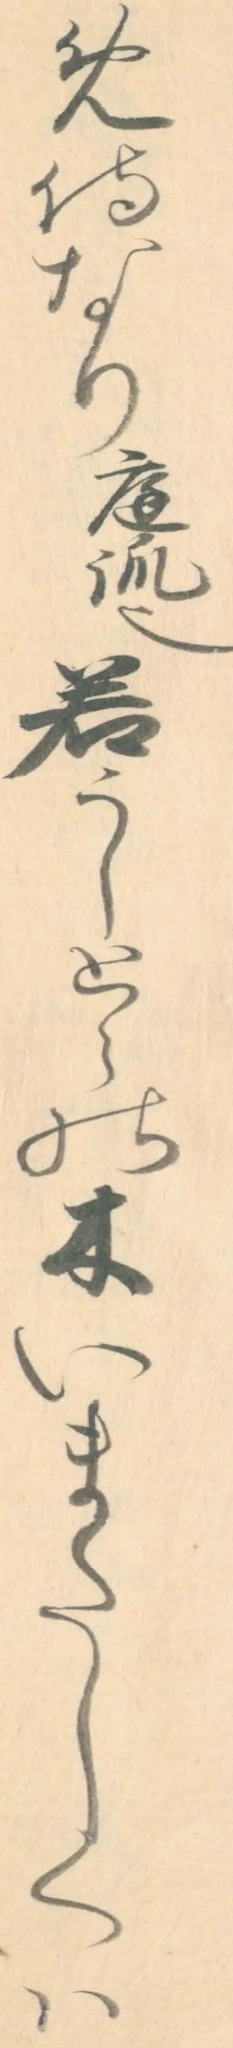め侍なり庭派也若うしとらの木いまたしくは

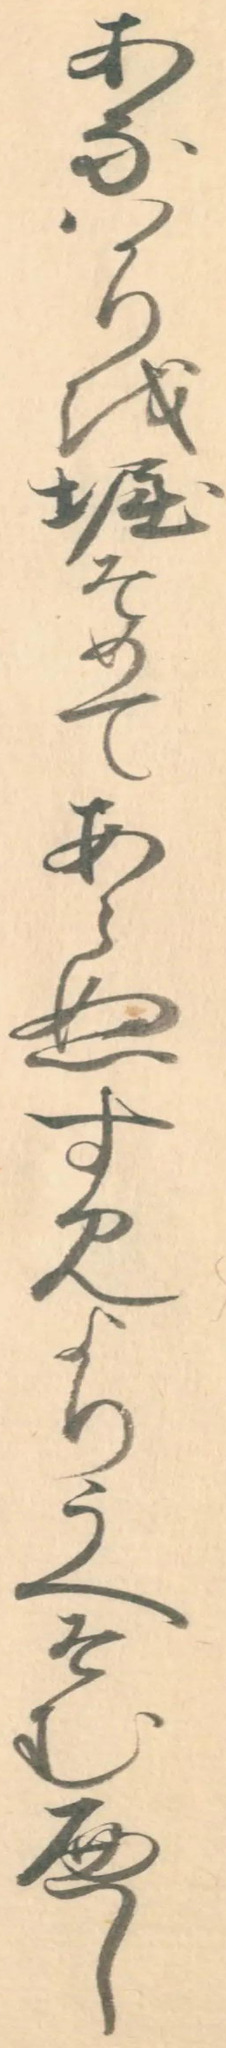あなはかりを堀そめてあらぬすみよりうへそむへし
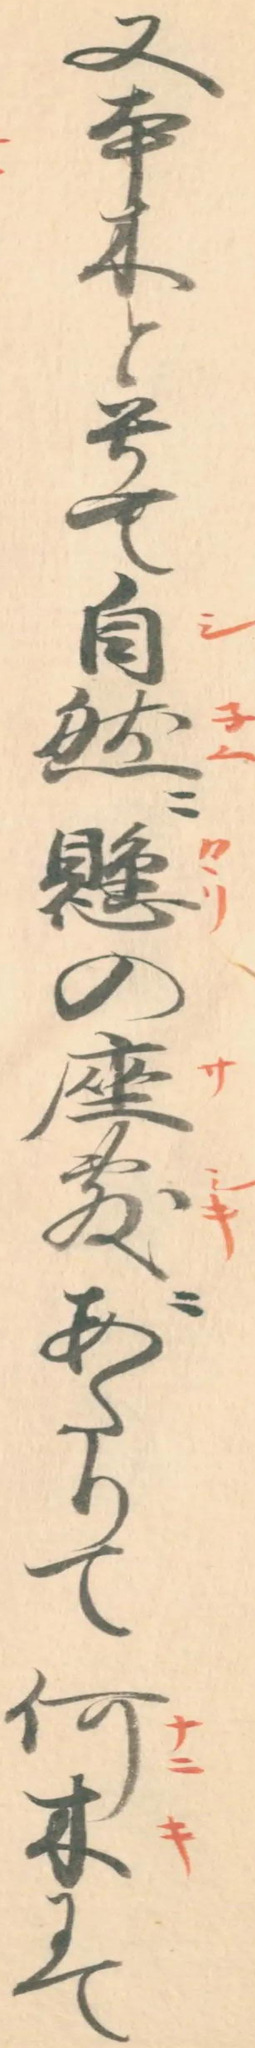又本木と号て自然に懸の座敷にあたりて何木にて
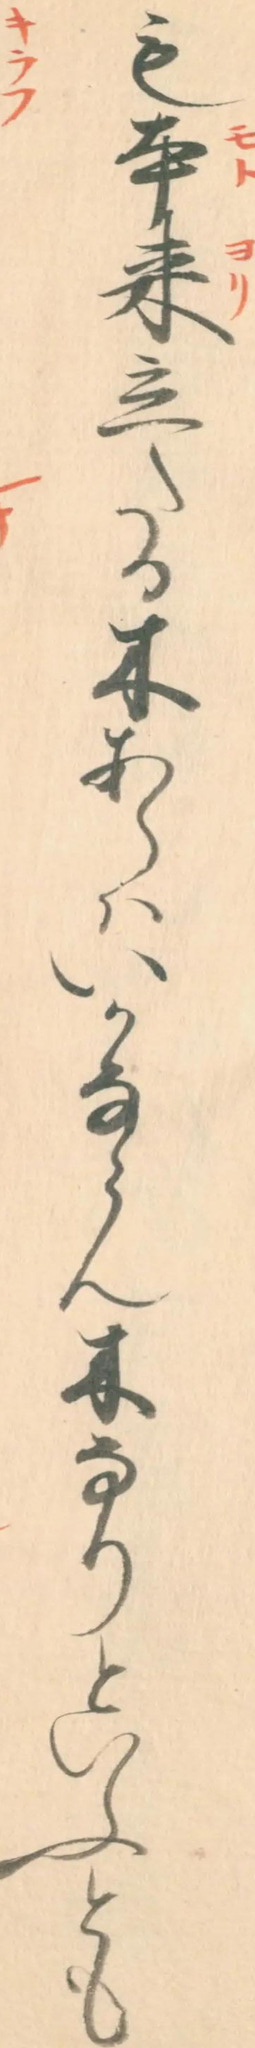も本来立たる木あらはいかならん木なりといふとも
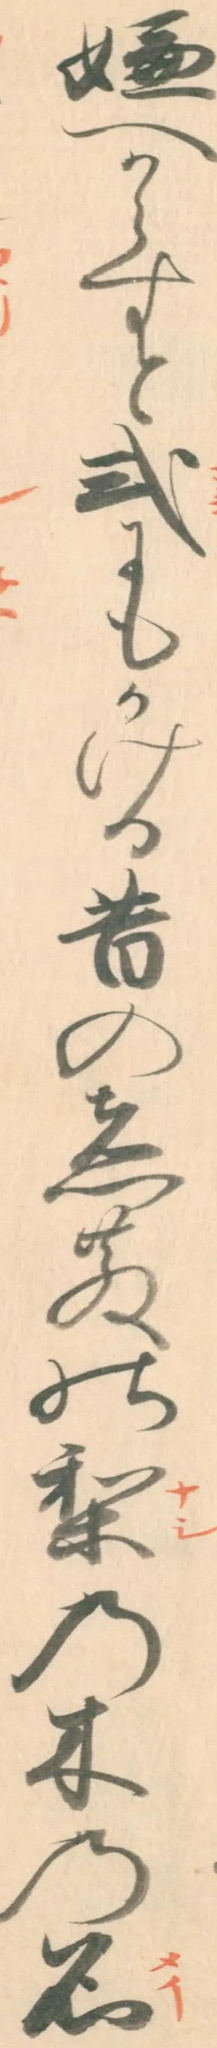嫌へからすと式にもかける昔の敷の梨の木の名
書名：遊庭秘抄 2巻. [1]
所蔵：国立国会図書館 National Diet Library, JAPAN
